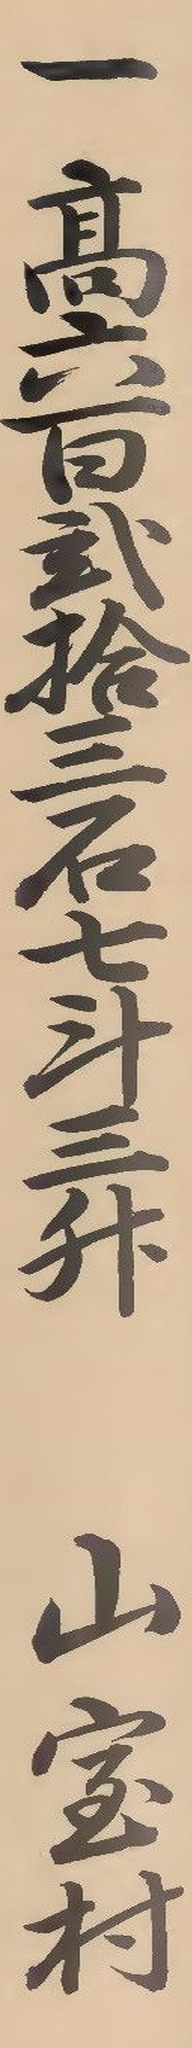一高六百弐拾三石七斗三升山室村
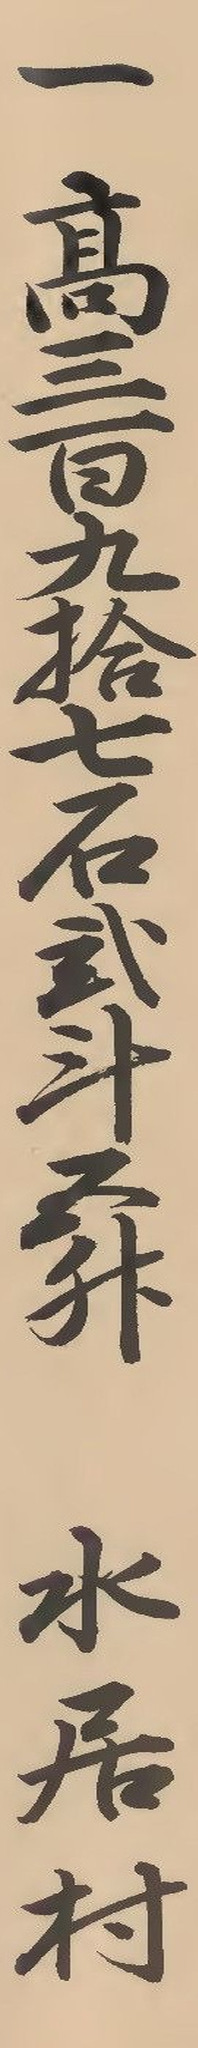一高三百九拾七石弐斗五升水居村
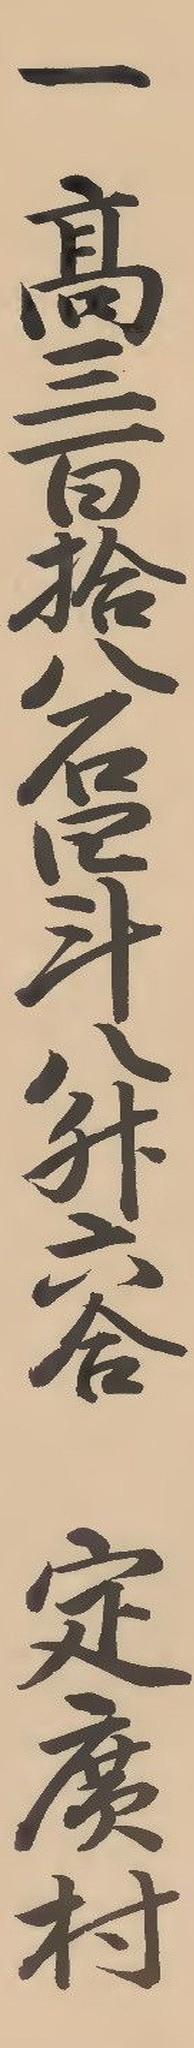一高三百拾八石四斗八升六合定広村
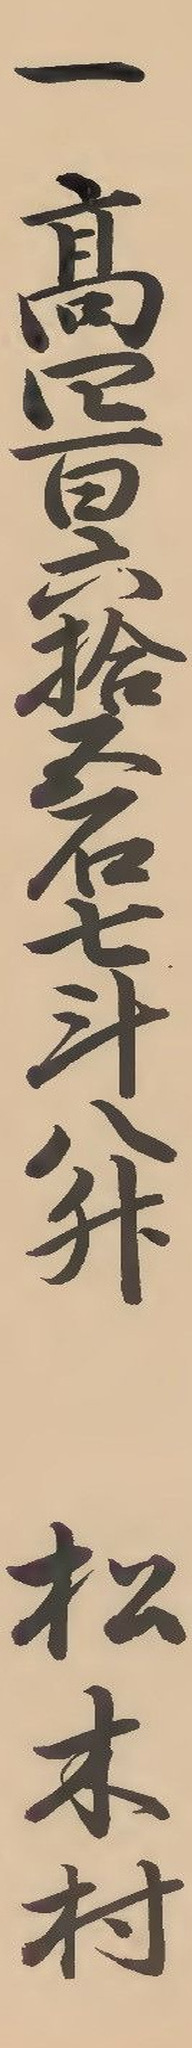一高四百六拾五石七斗八升松木村

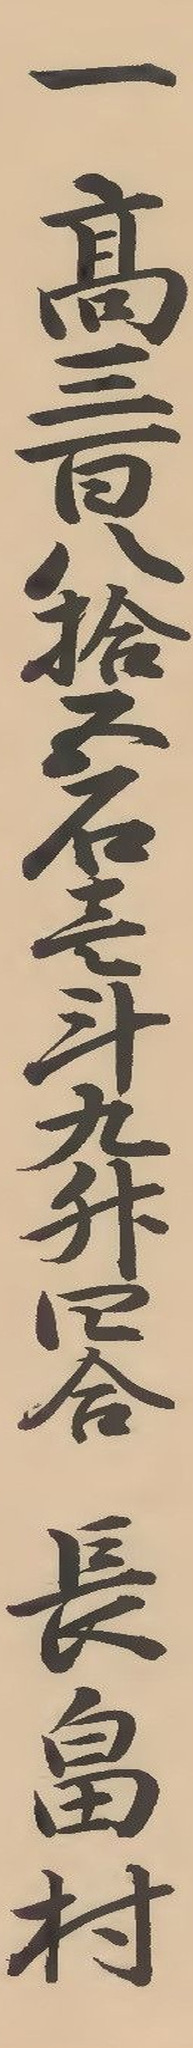一高三百八拾五石壱斗九升四合長畠村
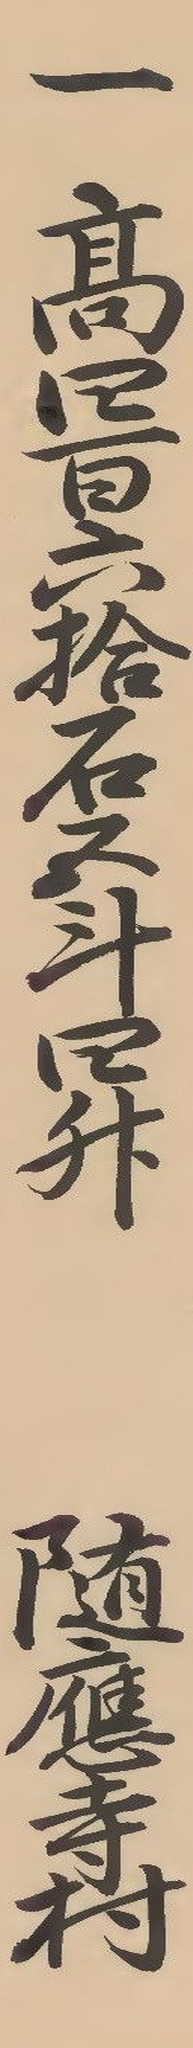一高四百六拾石五斗四升随応寺村
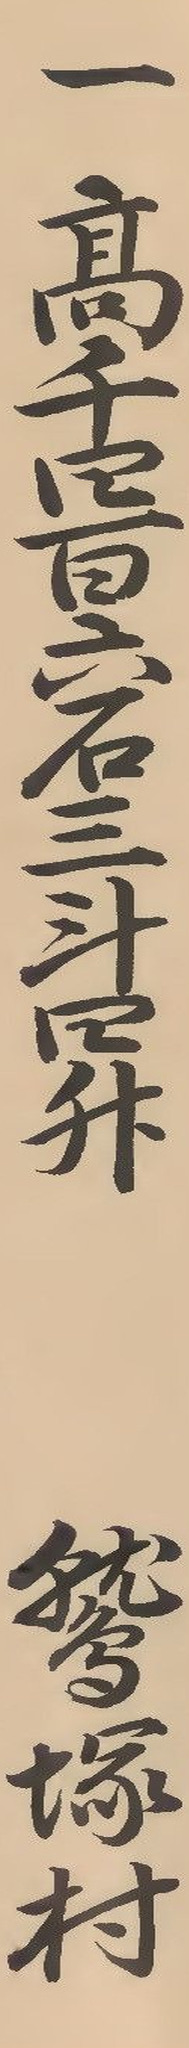一高千四百六石三斗四升鷲塚村
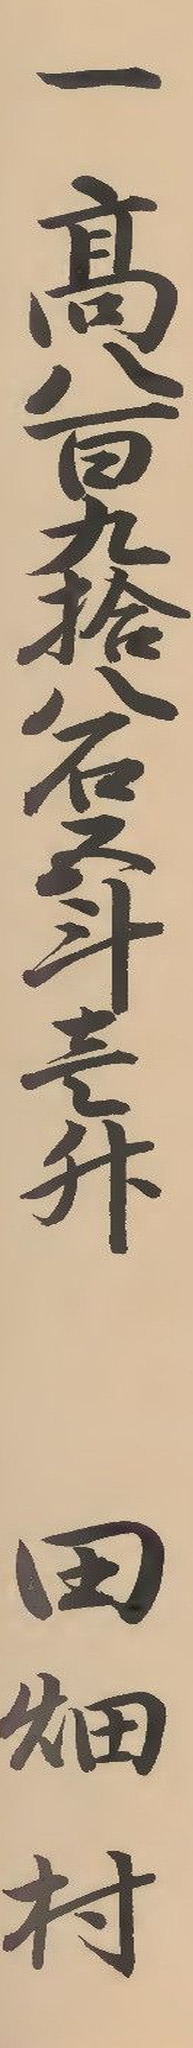一高八百九拾八石五斗壱升田畑村
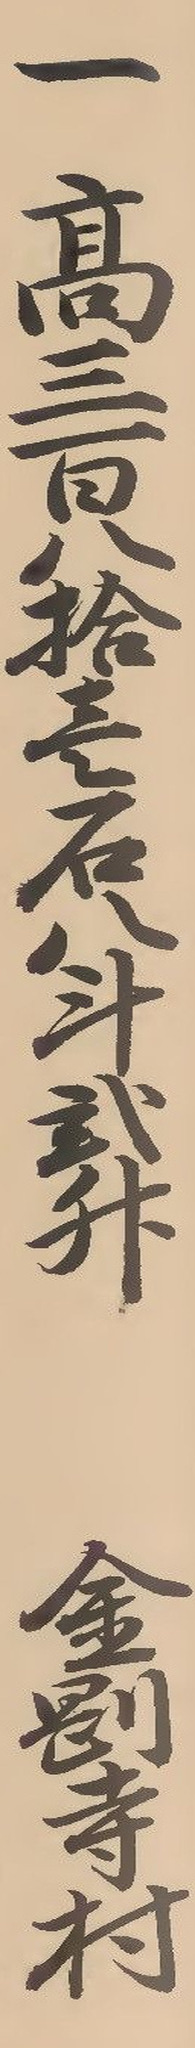一高三百八拾壱石八斗弐升金剛寺村
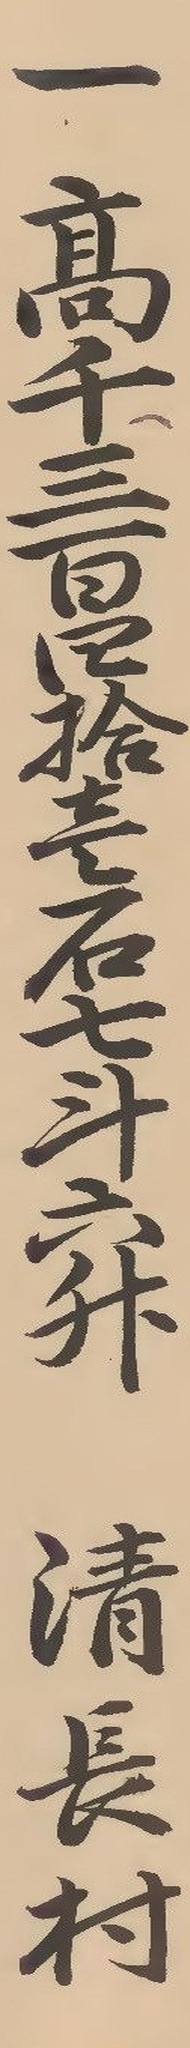一高千三百四拾壱石七斗六升清長村
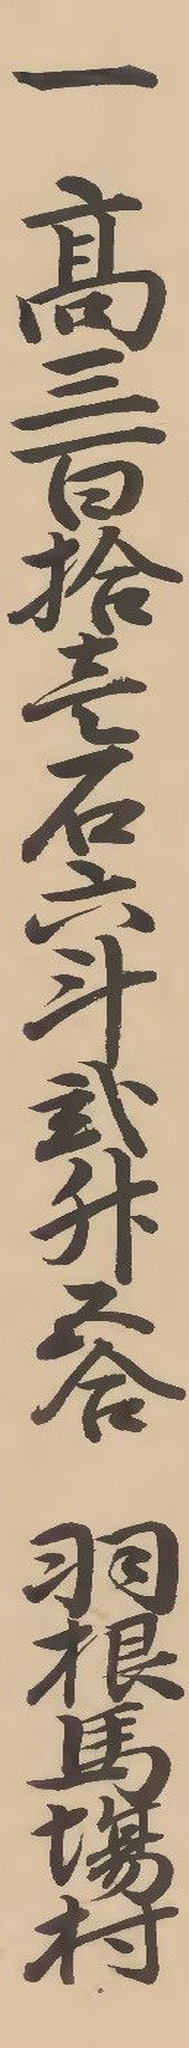一高三百拾壱石六斗弐升五合羽根馬場村
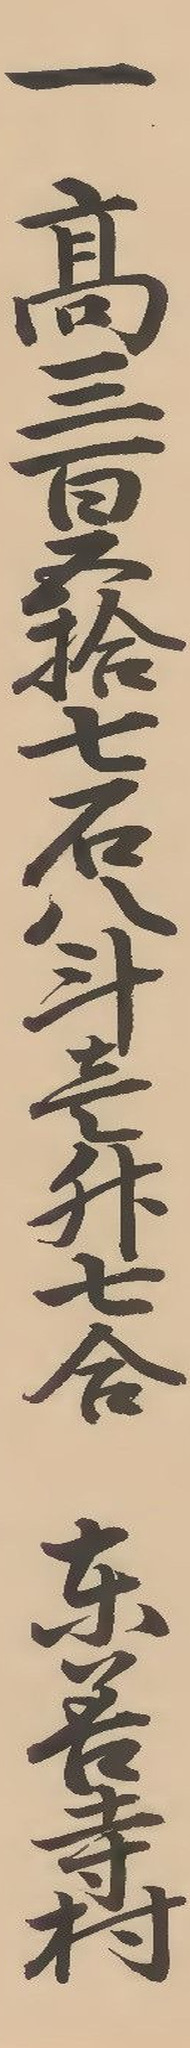一高三百五拾七石八斗壱升七合東善寺村

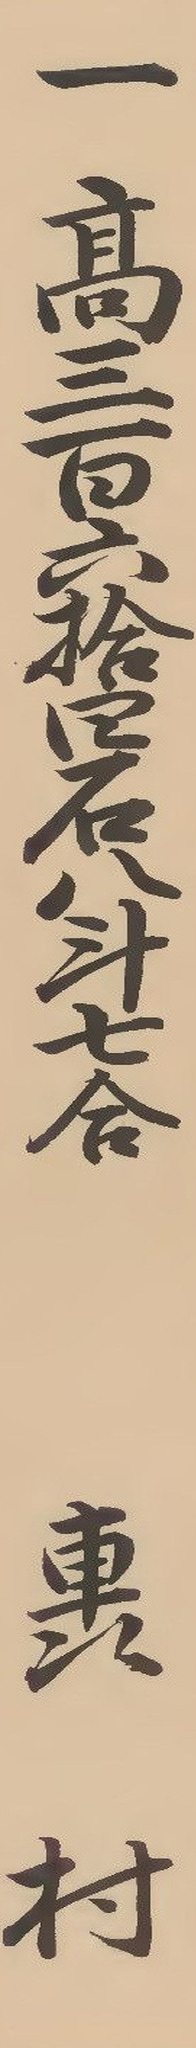一高三百六拾四石八斗七合轟村
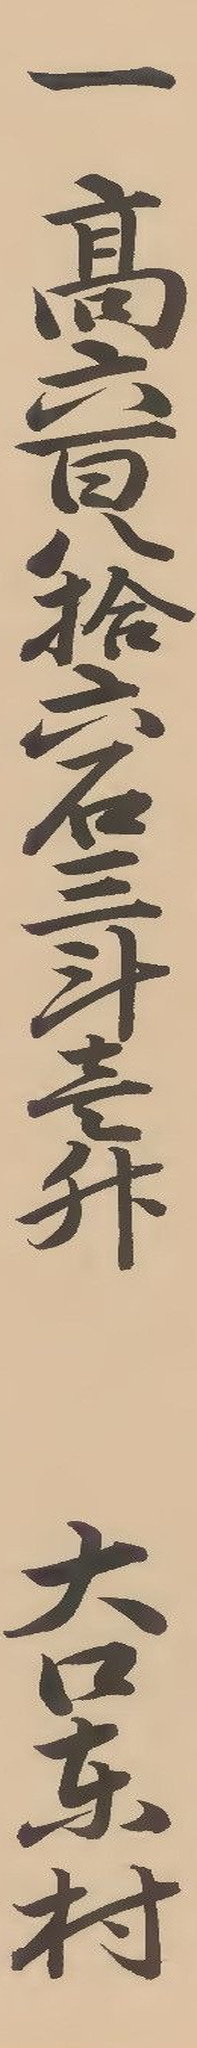一高六百八拾六石三斗壱升大口東村
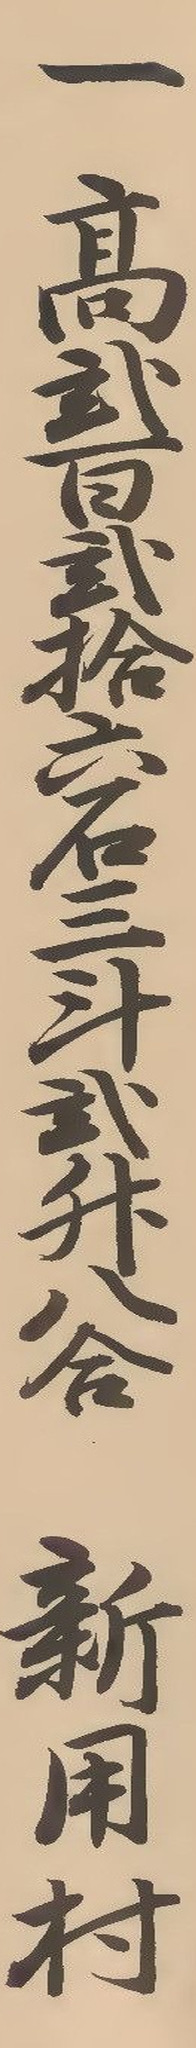一高弐百弐拾六石三斗弐升八合新用村
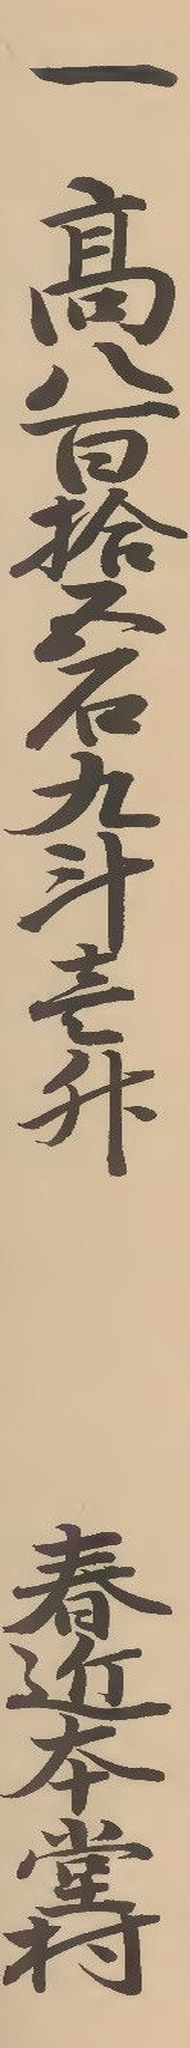一高八百拾五石九斗壱升春近本堂村
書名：越前国郷帳
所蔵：国立公文書館 National Archives of Japan
